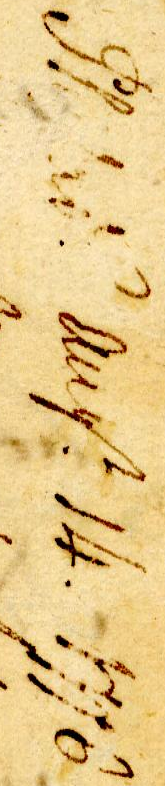Philad^a Aug^t. 14. 1776.
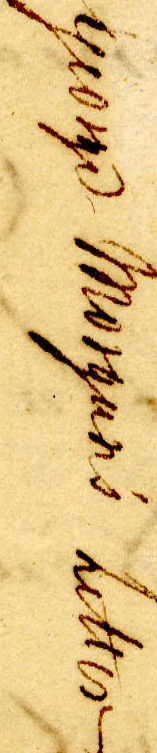George Morgan's Letter-.
